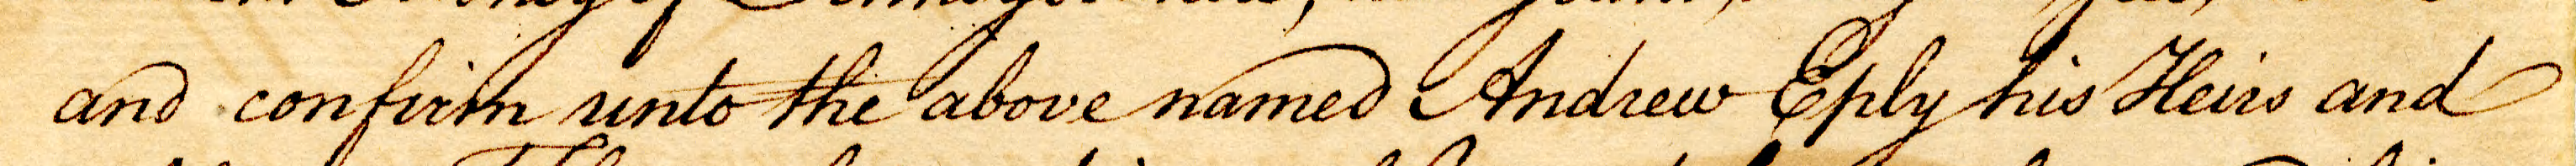and confirm unto the above named Andrew Eply his Heirs and
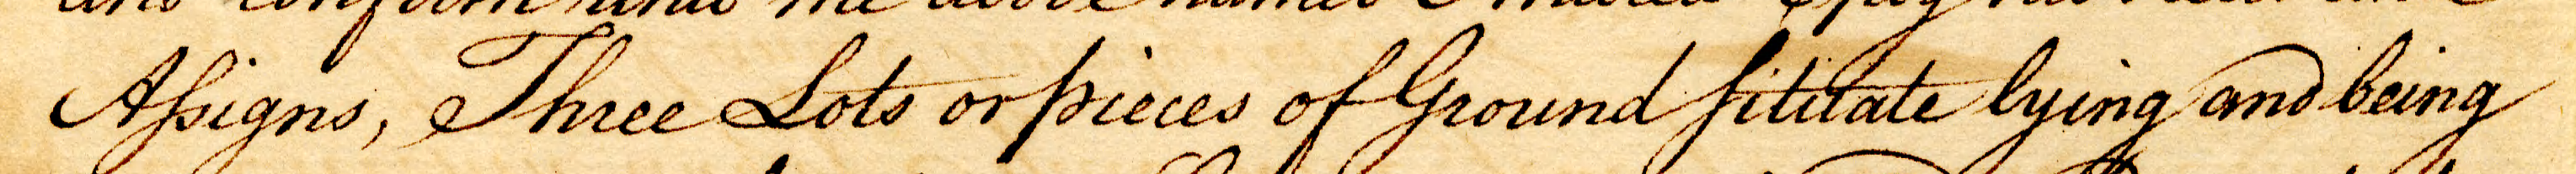Assigns, Three Lots or pieces of Ground situate lying and being
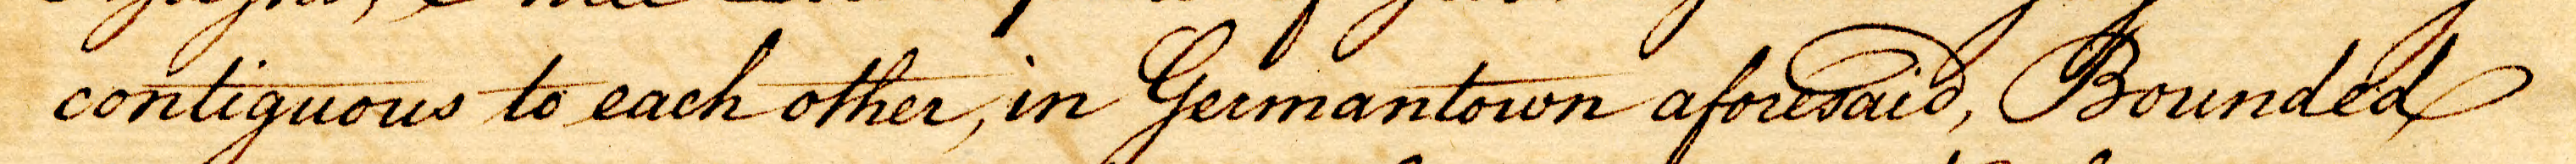contiguous to each other, in Germantown aforesaid, Bounded
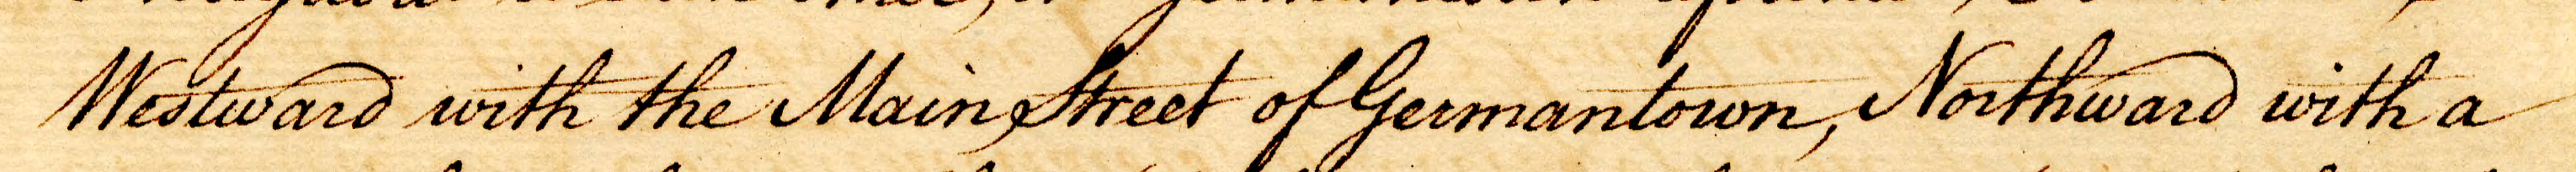Westward with the Main Street of Germantown, Northward with a
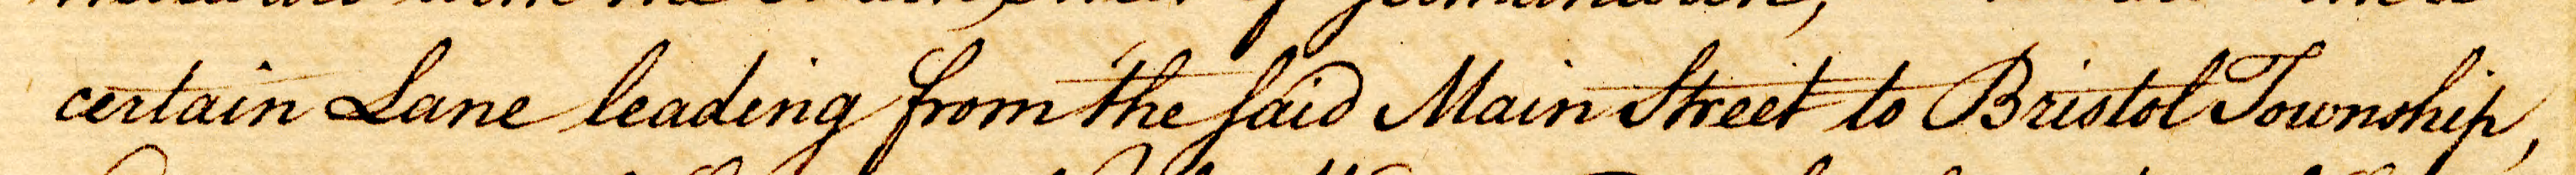certain Lane leading from the said Main Street to the Bristol Township,
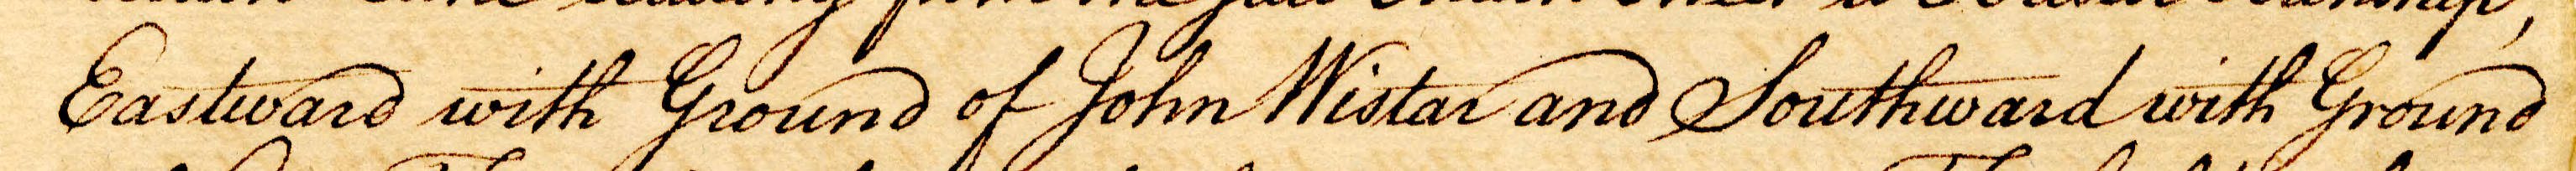Eastward with Ground of John Wistar and Southward with Ground
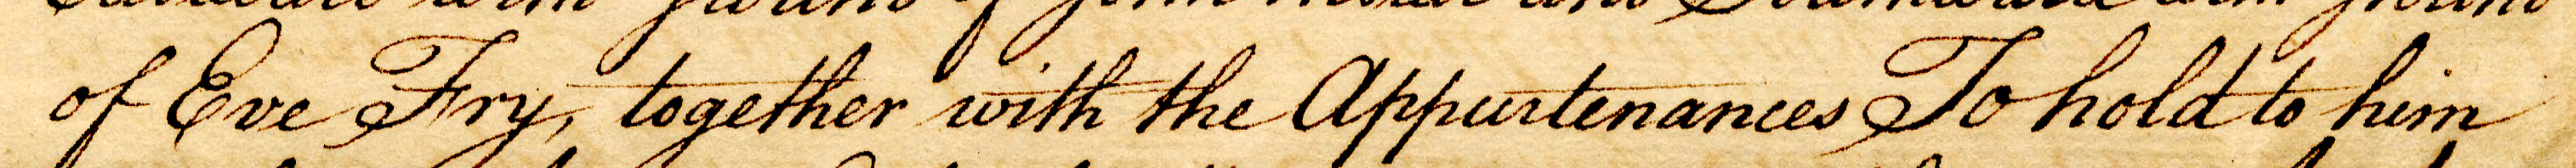of Eve Fry, together with the Appurtenances. To hold to him
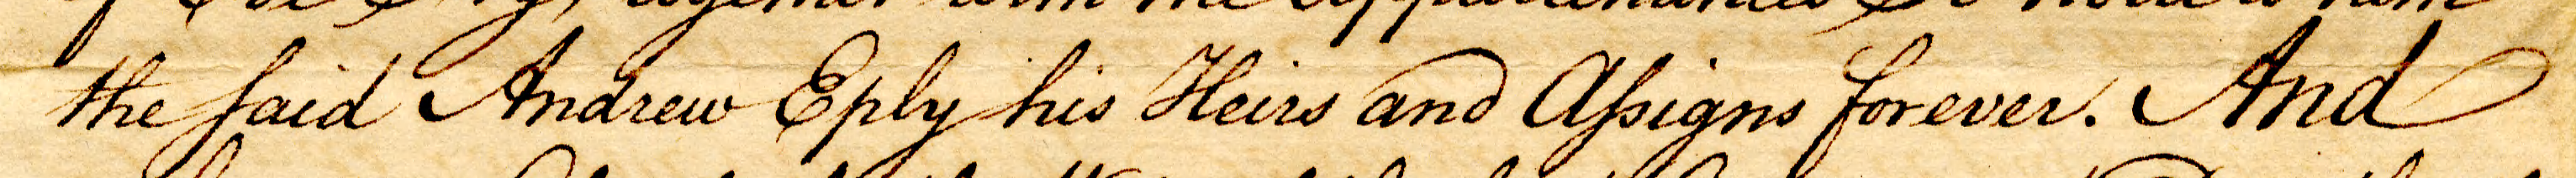the said Andrew Eply his Heirs and Assigns forever. And
